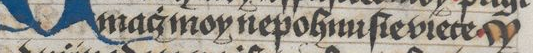macż moy nepohnuſie víece.Y
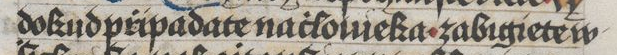dokud pṙípadate na ċlouieka.zabigíete w¬
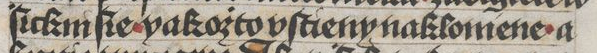ẛickni ſie.yakożto vſtieny nakloníene.a
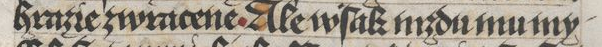hrazie zwracene.Ale wẛak mzdu mu my¬
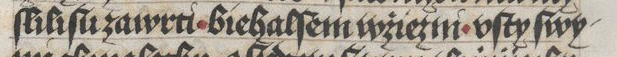ſlili ſu zawrti.bíehalſem wżiezni.vſty ſwy¬
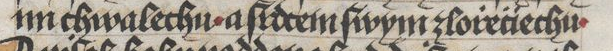mi chwalechu.a ſrdcem ſwym zloṙeċíechu.
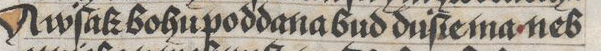Awẛak bohu poddana bud duẛie ma.neb
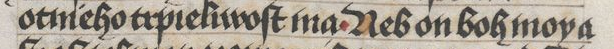otnieho trpieliwoſt ma.Neb on boh moy a
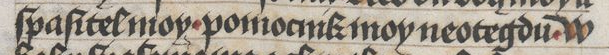ſpaſitel moy.pomocník moy neotegdu.W
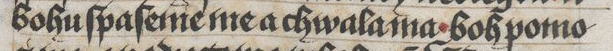bohu ſpaſenie me a chwala ma.boh pomo¬
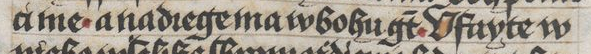ci me.a nadiege ma w bohu ḡt.Vſayte w
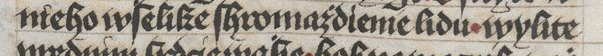nieho wẛelike ſhromażdieníe lidu.wylite
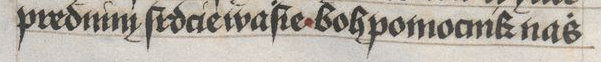prednim ſrdcie waẛie.boh pomocník naṡ
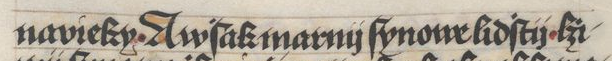navieky.Awẛak marnij ſynowe lidẛtij.lżi¬
